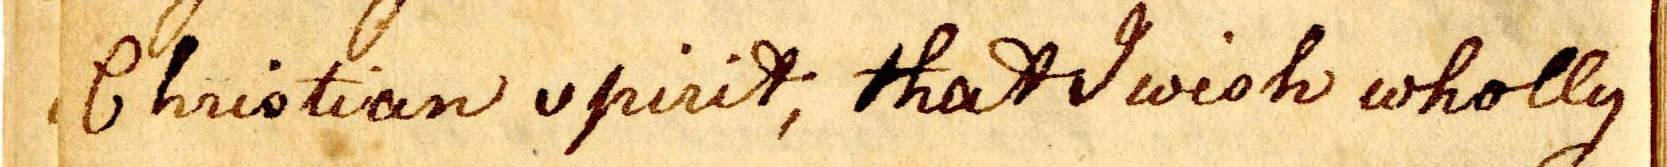Christian spirit, that I wish wholly
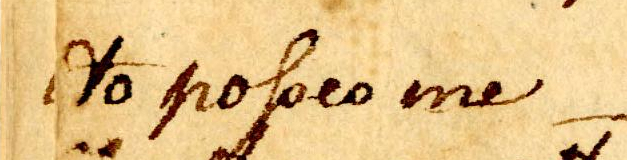to posses me
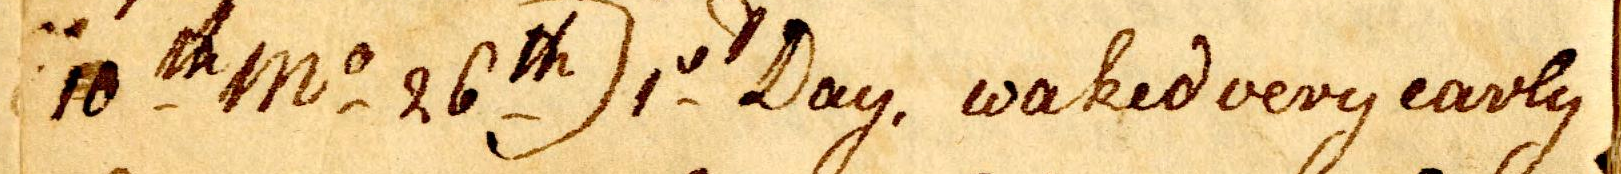10^th M^o 26^th) 1^st Day, waked very early
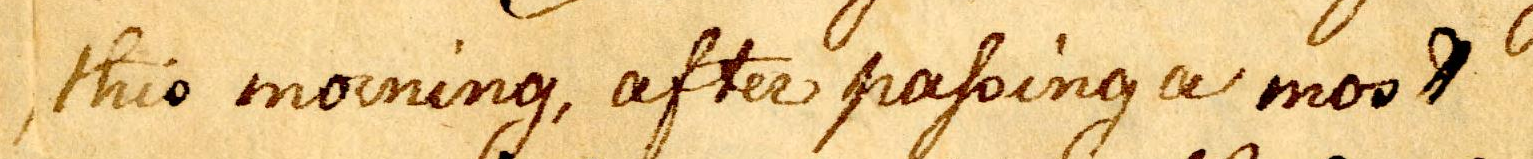this morning, after passing a most
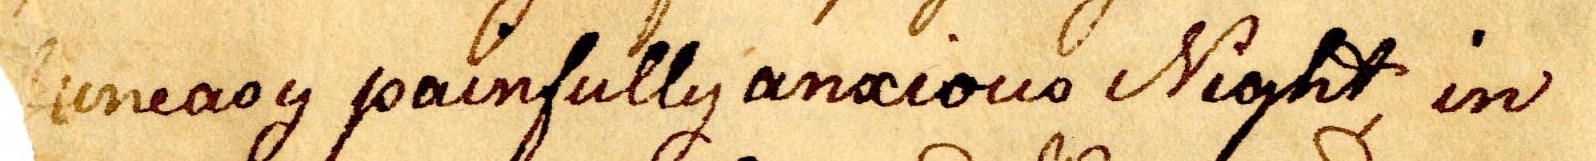uneasy painfully anxious Night, in
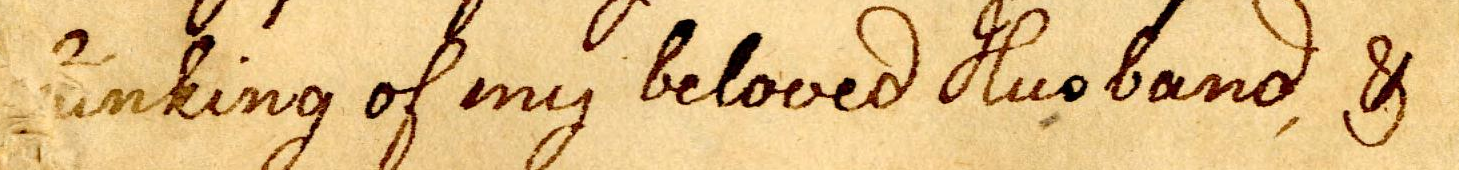hinking of my beloved Husband, &
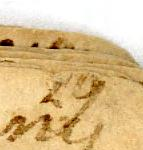29
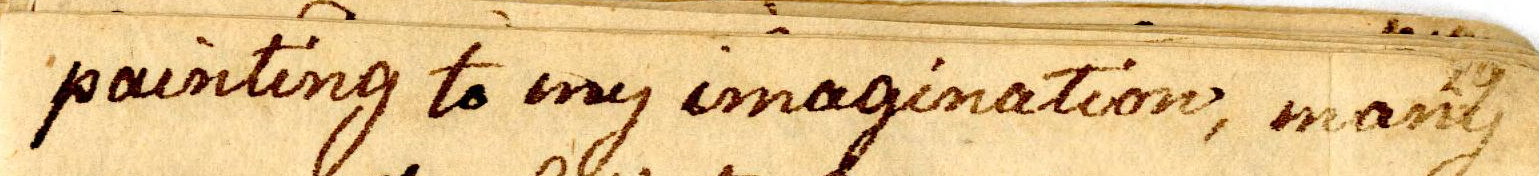painting to my imagination, many
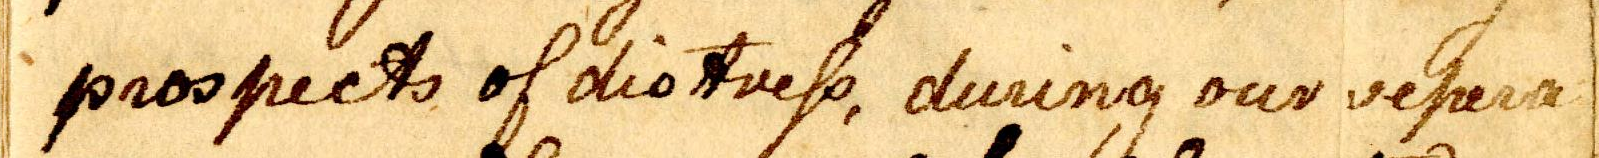prospects of distress, during our sepera
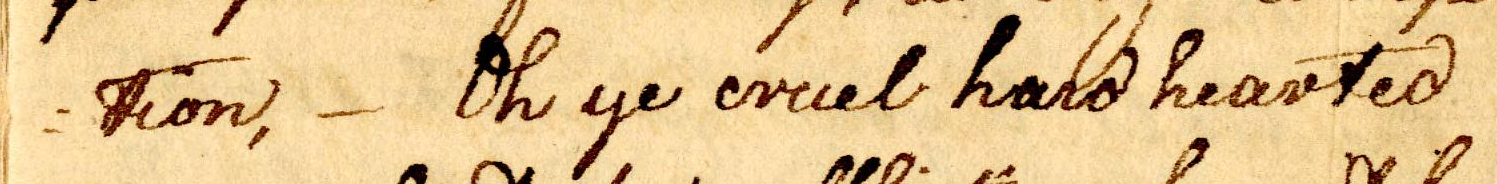-tion,- Oh ye cruel hard hearted
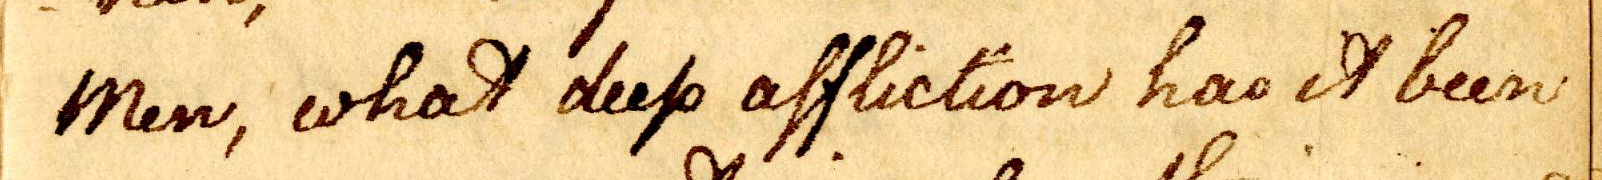Men, what deep affliction has it been
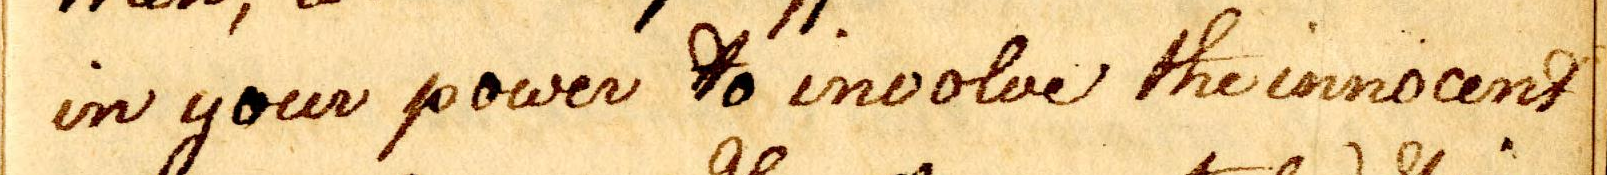in your power to involve the innocent
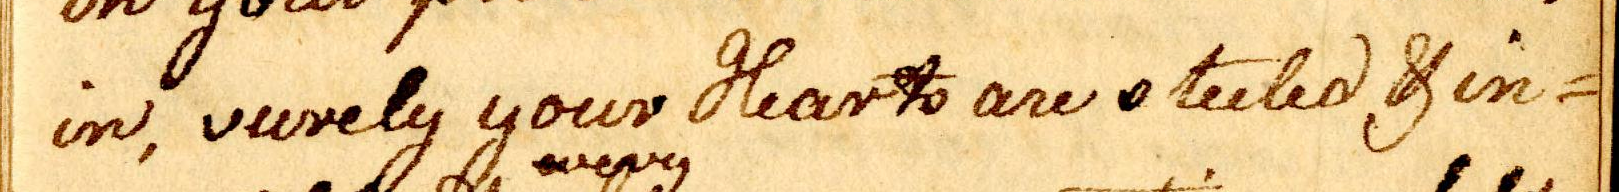in, surely your Hearts are steeled & in-
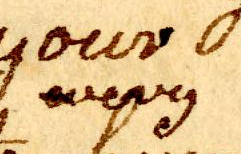every
